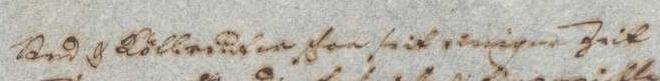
Sand & Köllreuter schon seit einiger Zeit
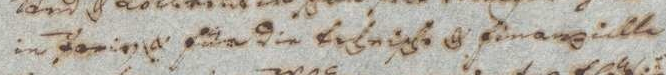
in Paris & für die technische & finanzielle
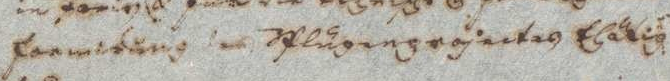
Formirung des Splügenprojectes thätig
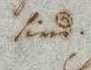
sind.
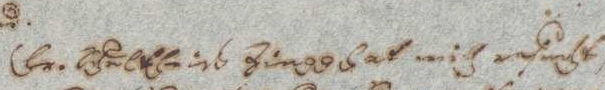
Hr. Schultheiß Zingg hat mich ersucht,
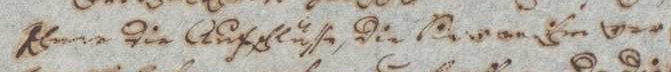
Ihnen die Aufschlüsse, die Sie von ihm ver-
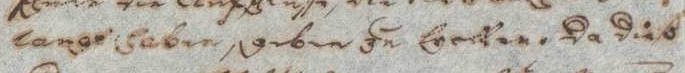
langt haben, geben zu wollen. Da dieß
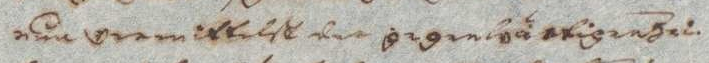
nun vermittelst der gegenwärtigen Zei-
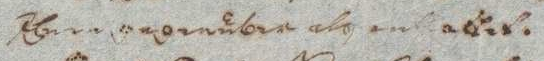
Ihnen gegenüber als entlastet.
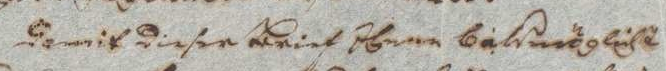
Damit dieser Brief Ihnen baldmöglichst
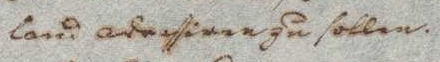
land adressiren zu sollen.
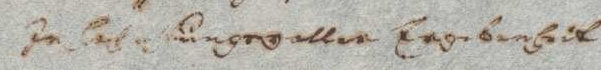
In hochachtungsvoller Ergebenheit
